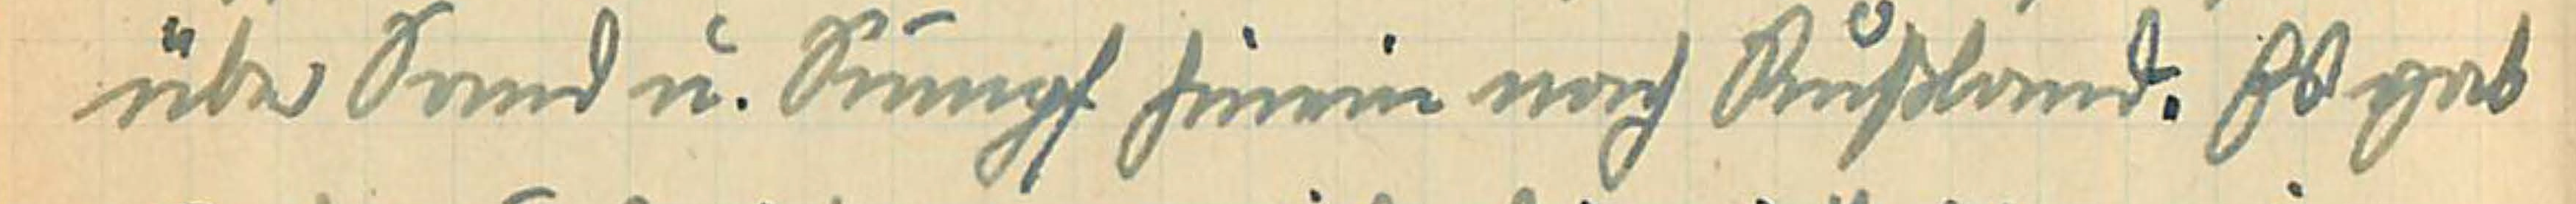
über Sand u. Sumpf hinein nach Rußland. Es gab
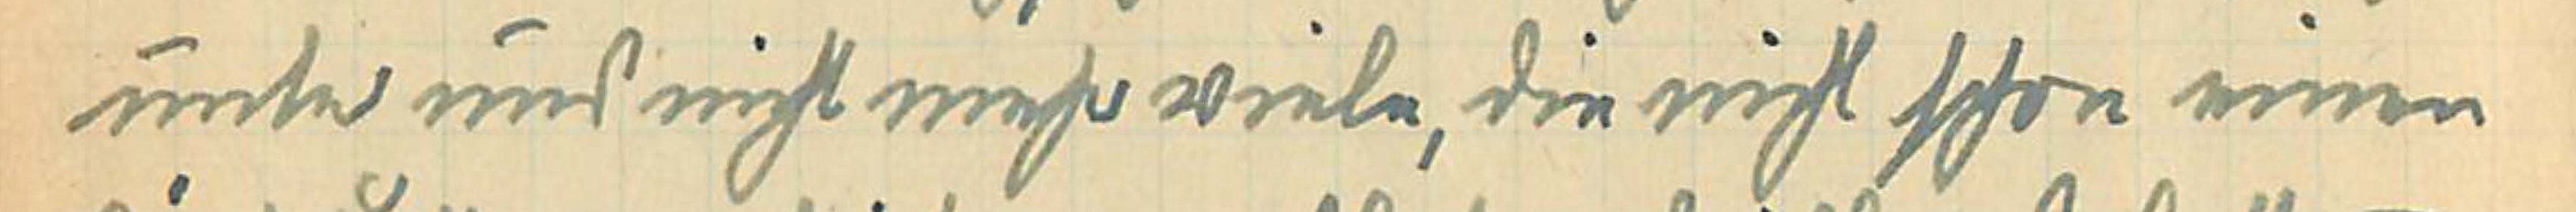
unter uns nicht mehr viele, die nicht schon einen
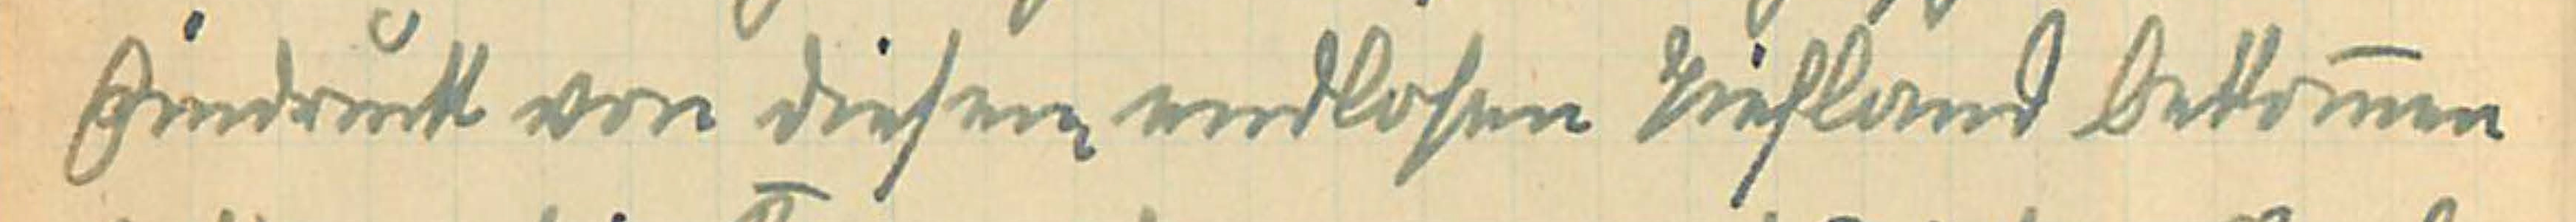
Eindruck von diesem endlosen Tiefland bekommen
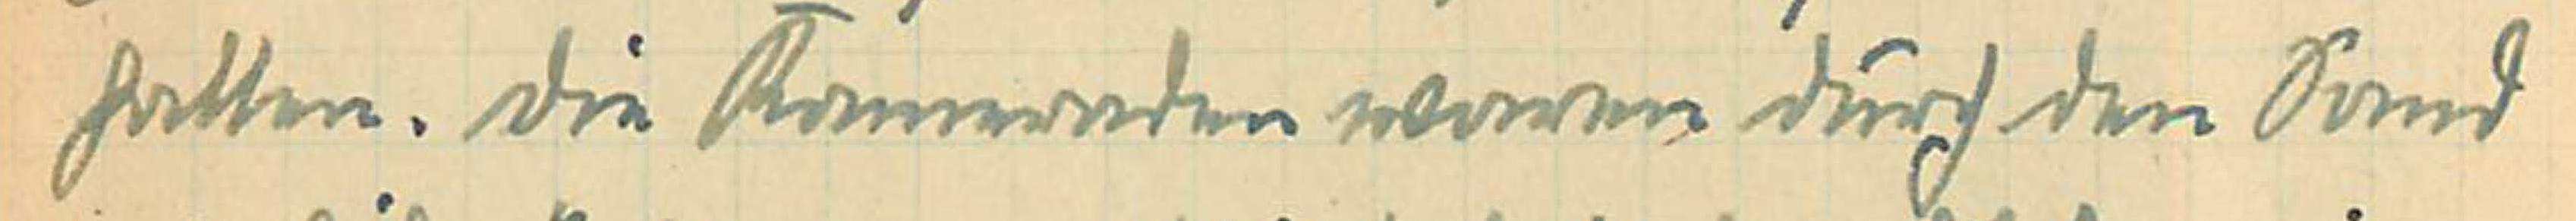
hatten. Die Kameraden waren durch den Sand
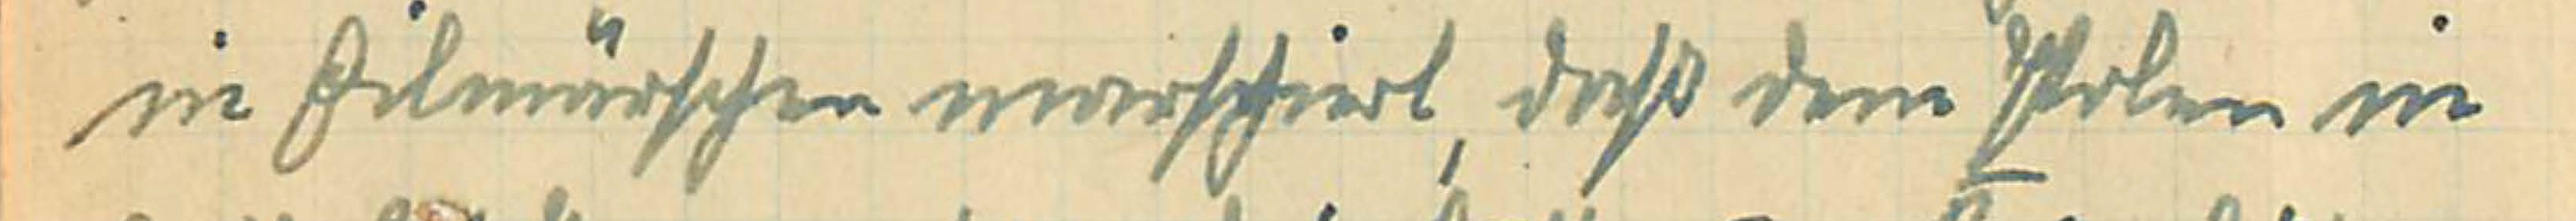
in Eilmärschen marschiert, daß dem Polen in
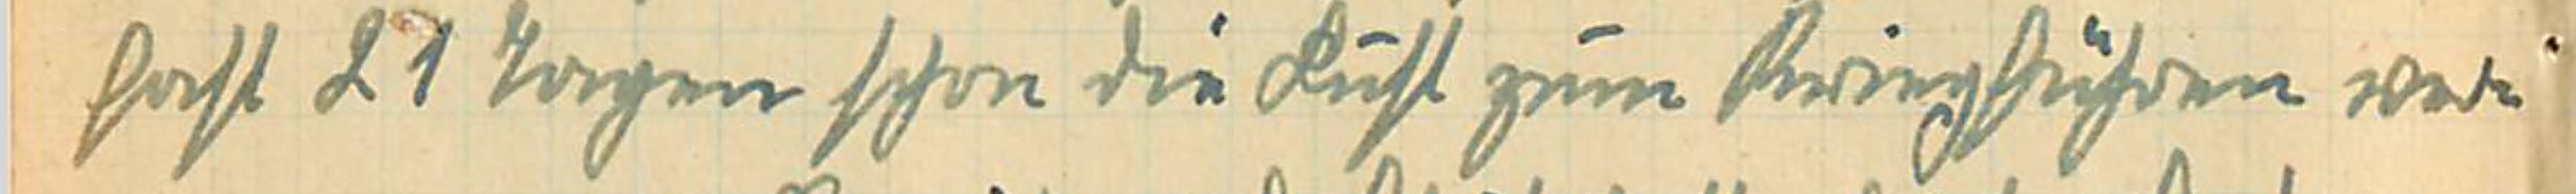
fast 21 Tagen schon die Lust zum Kriegführen ver-
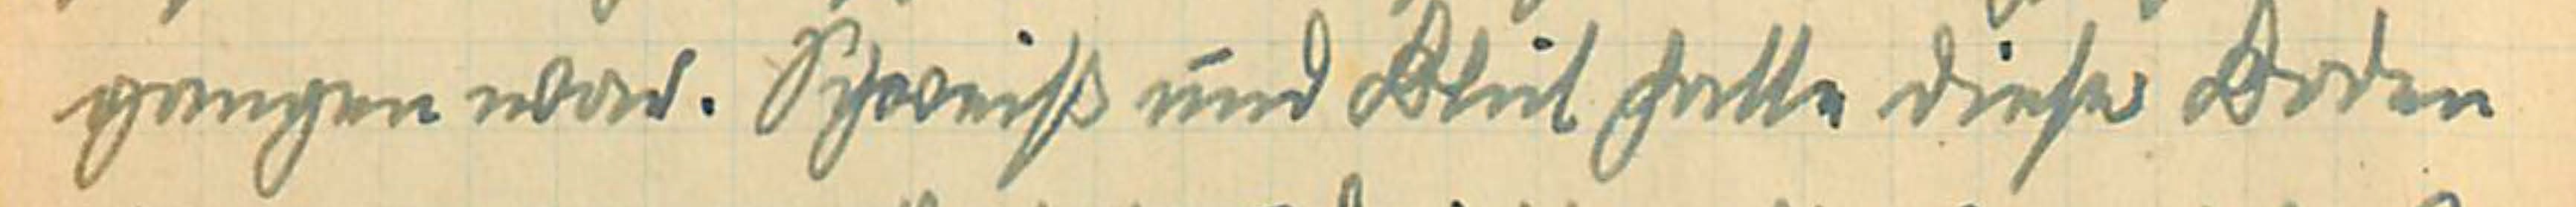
gangen war. Schweiß und Blut hatte dieser Boden
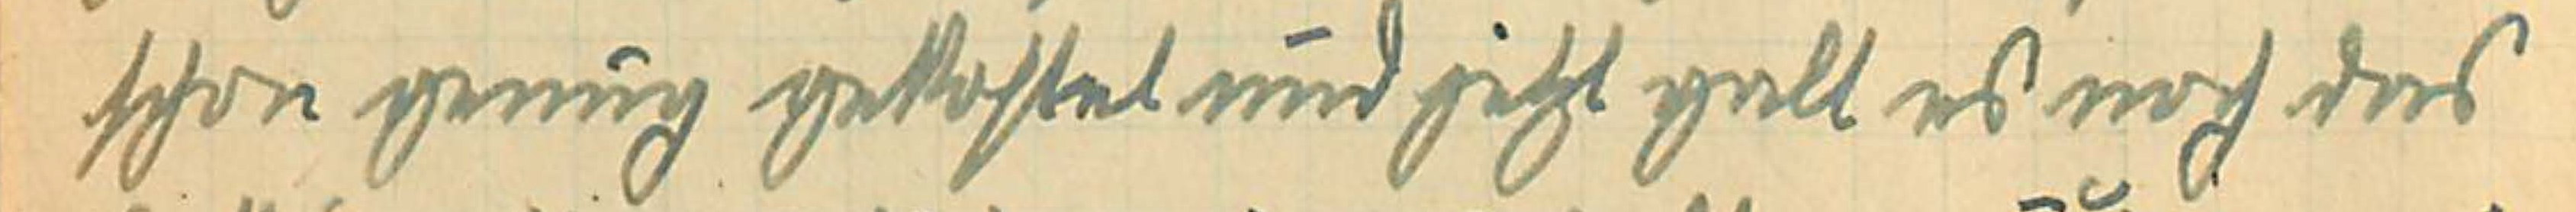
schon genug gekostet und jetzt galt es noch das
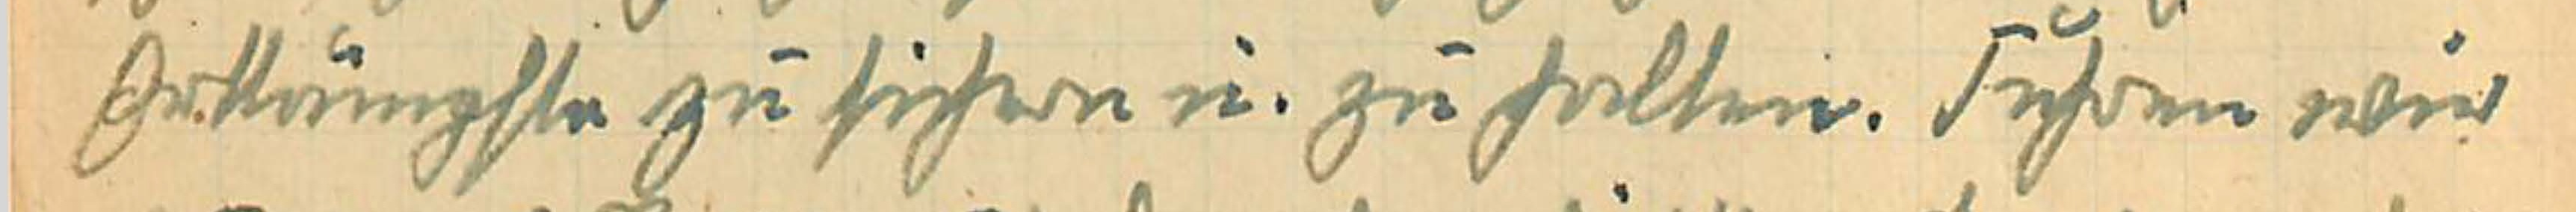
Erkämpfte zu sichern u. zu halten. Fuhren wir
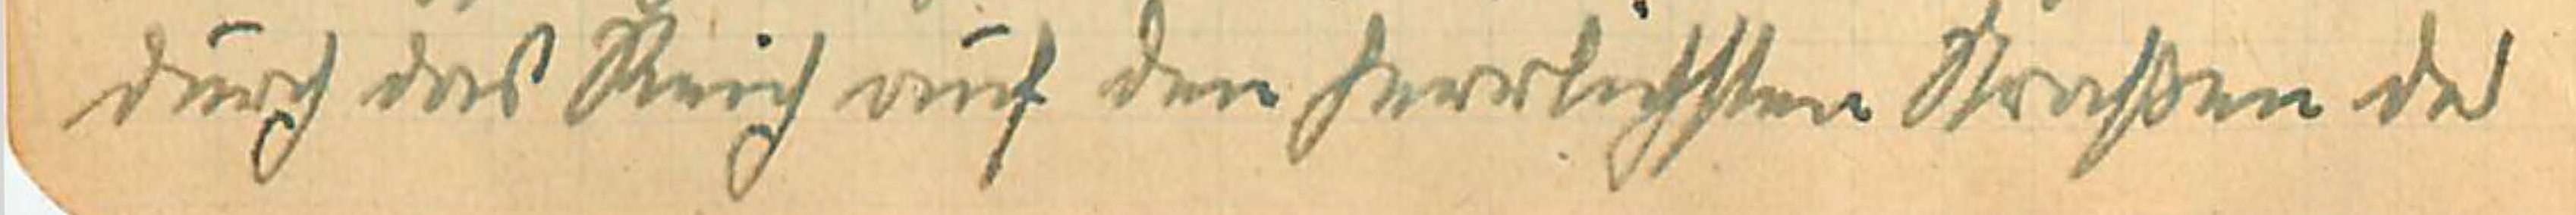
durch das Reich auf den herrlichsten Straßen der
